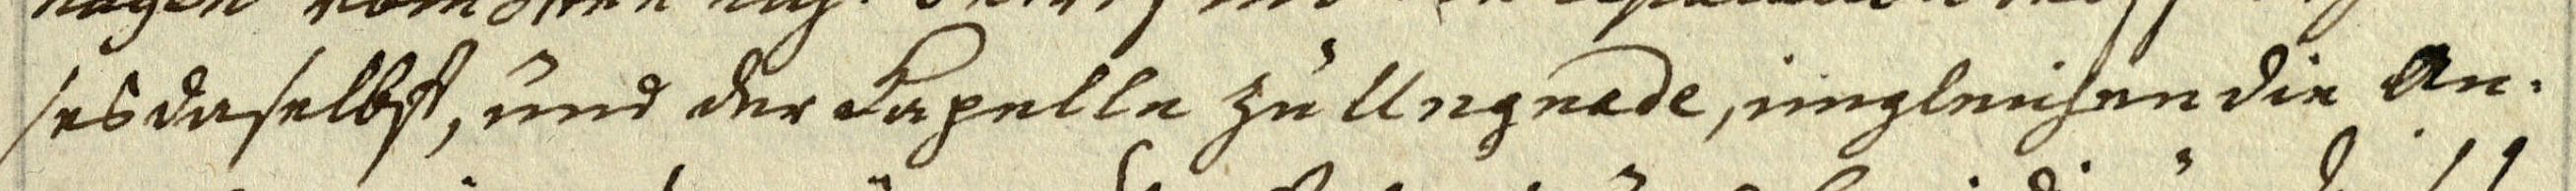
ses daselbst, und der kapelle zu Ungnade, imgleichen die An¬
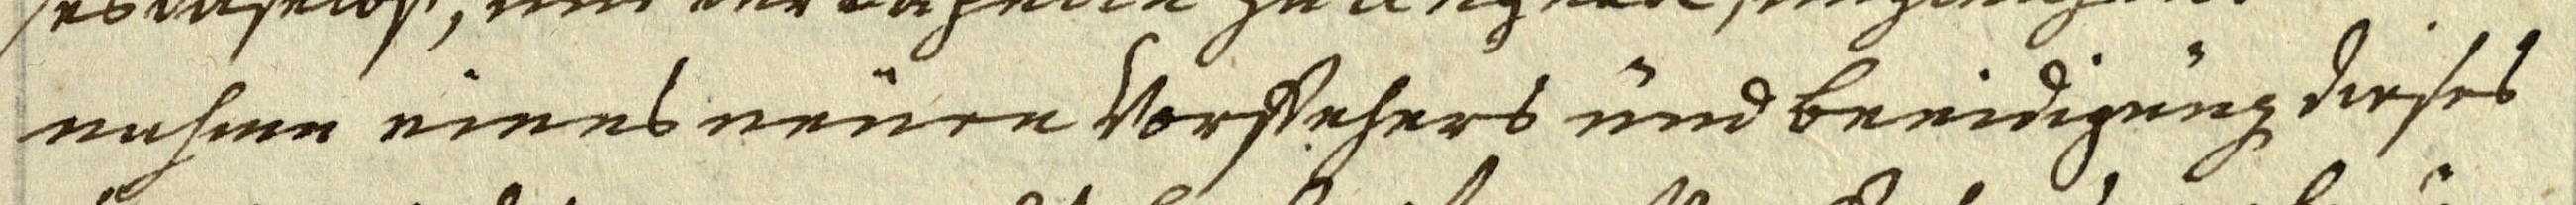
nahme eines neuen Vorstehers und Beeidigung dieses
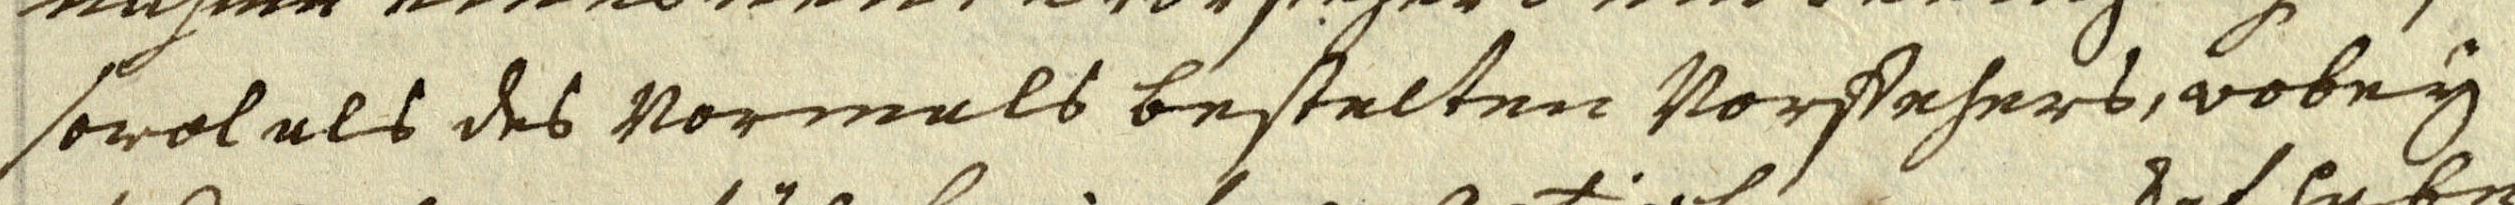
sowol als des vormals bestelten Vorstehers, wobeÿ
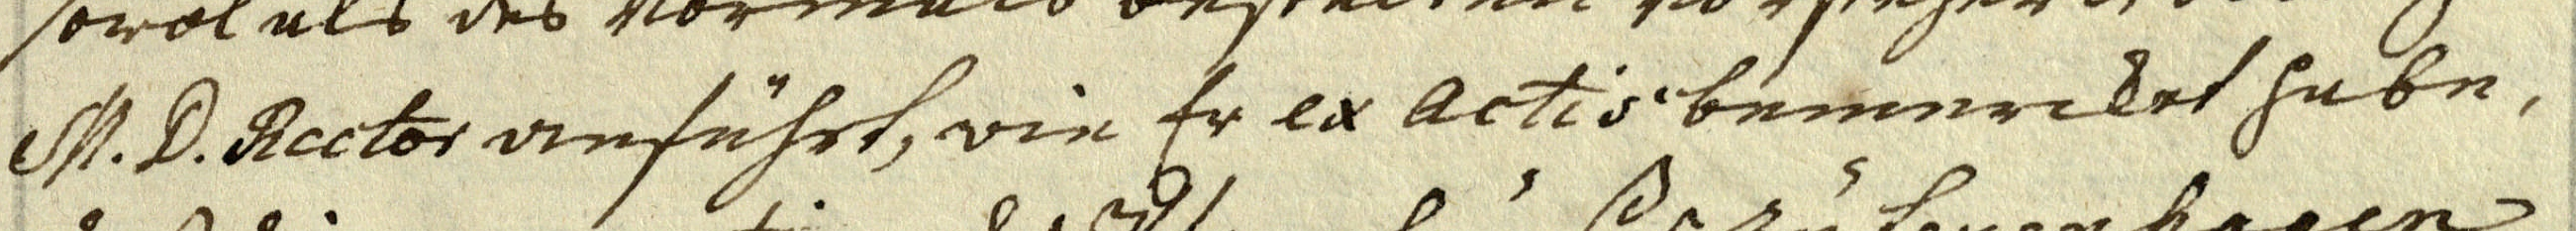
M. D. Rector anführt, wie Er ex Actis bemercket habe,
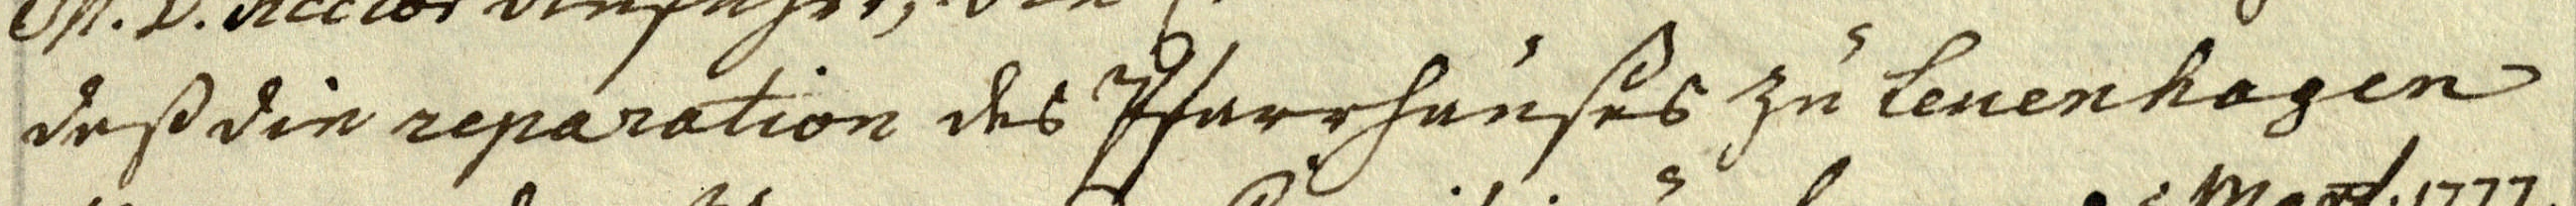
daß die reparation des Pfarrhauses zu Levenhagen
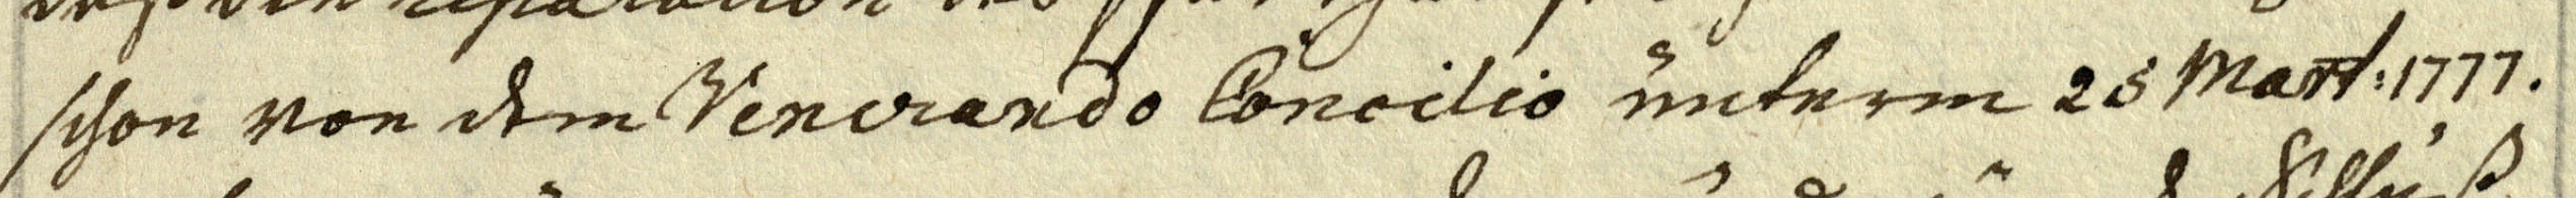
schon von dem Venerando Concilio unterm 23 Mart. 1777.
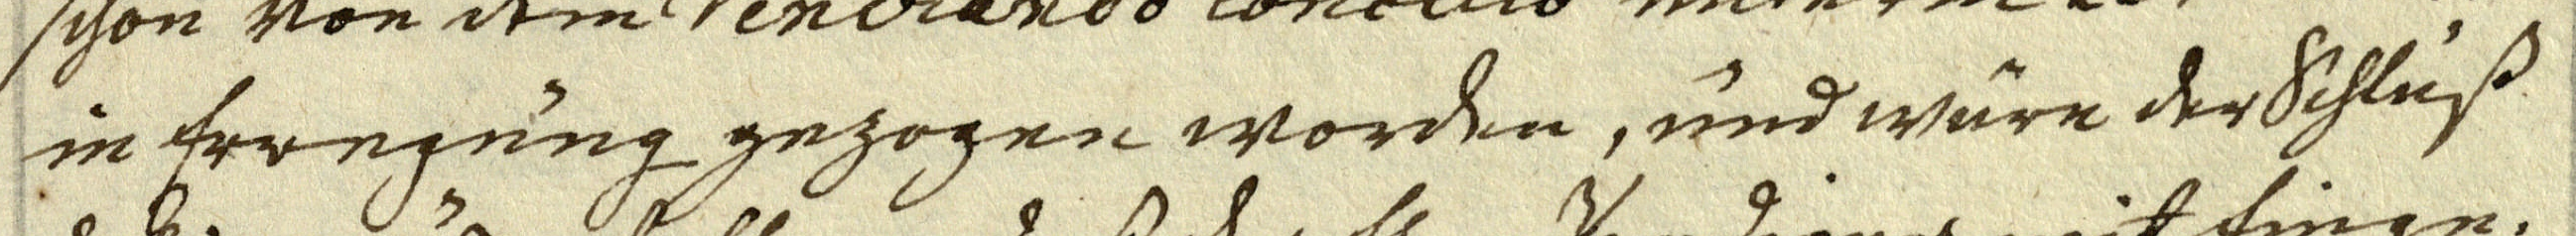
in Erwegung gezogen worden, und wäre der Schluß
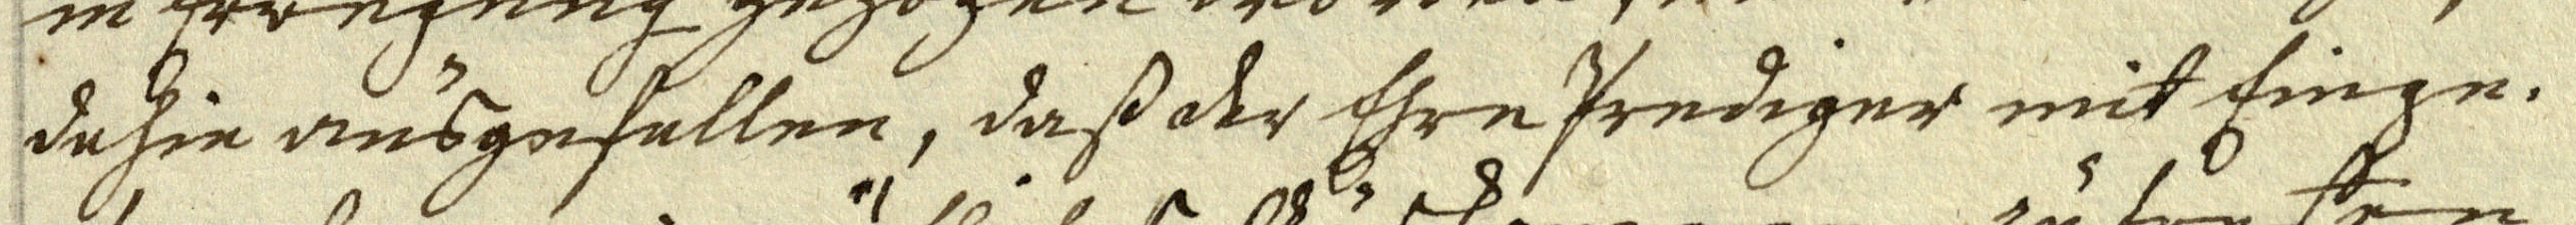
dahin ausgefallen, daß der Ehre Prediger mit Einge¬
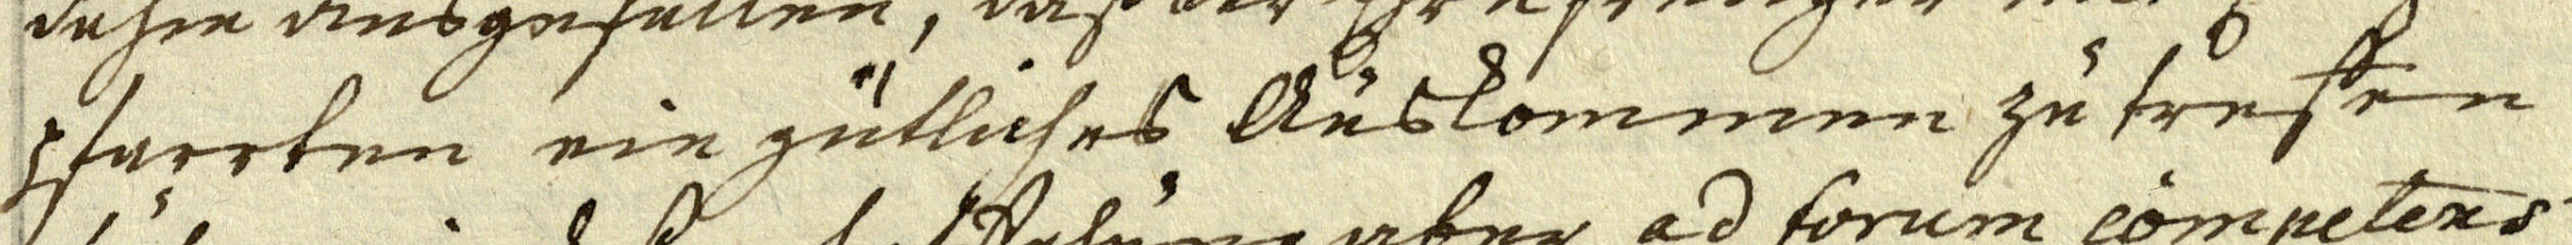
pfarrten ein gütliches Auskommen zu treffen
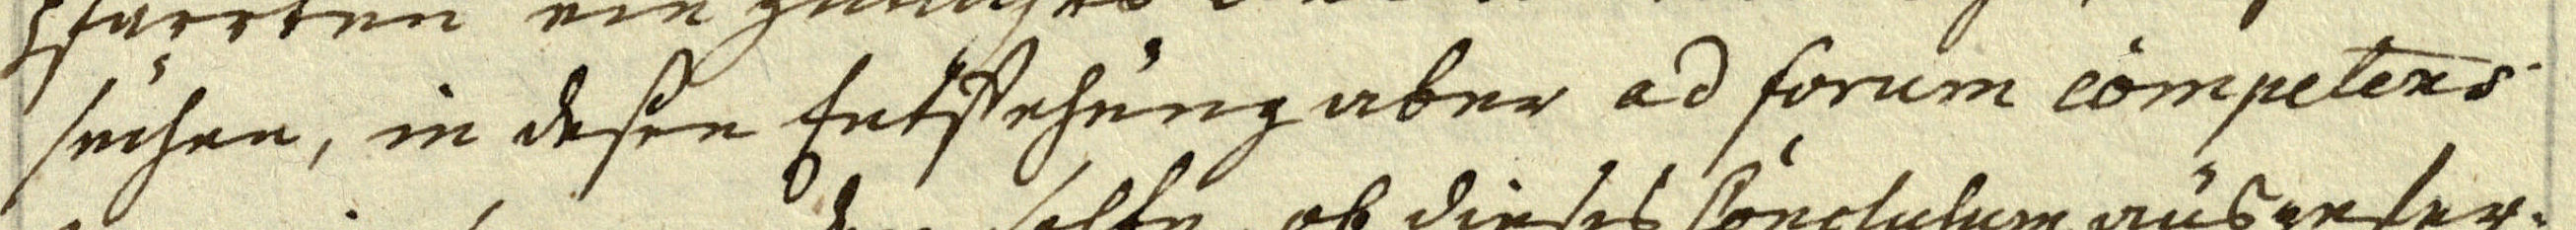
suchen, in deßen Entstehung aber ad forum competens
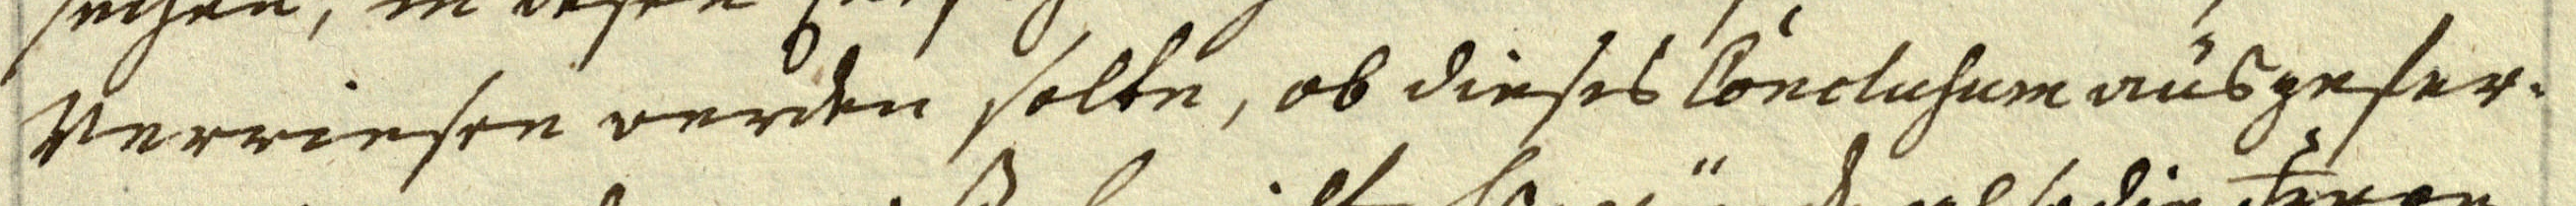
verwiesen werden solte, ob dieses Conclusum ausgefer¬
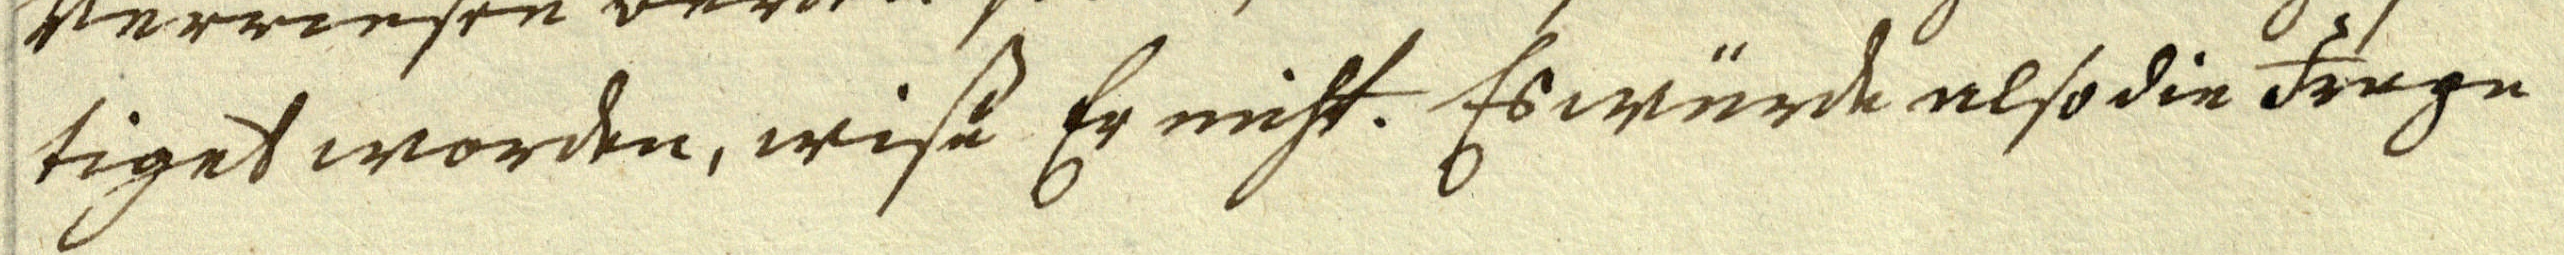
tiget worden, wiße Er nicht. Es würde also die Frage
